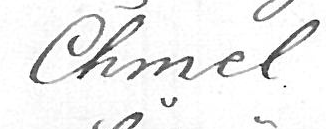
Chmel
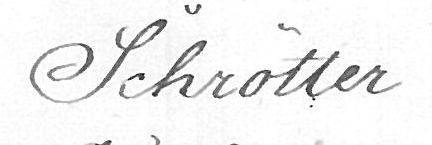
Schrötter
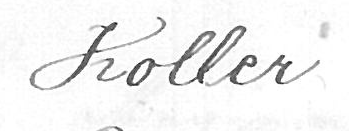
Koller
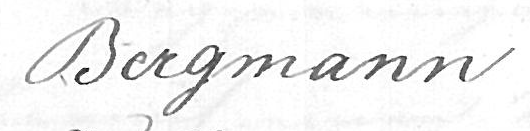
Bergmann
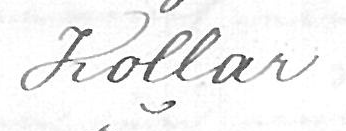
Kollar
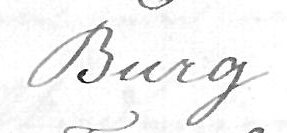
Burg
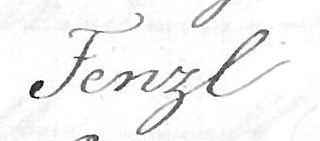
Fenzl
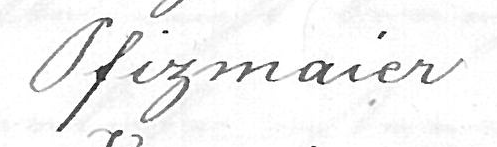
Pfizmaier
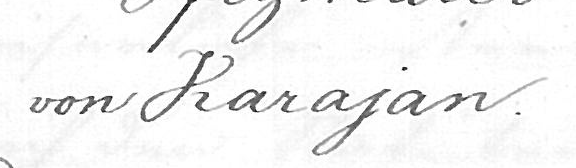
von Karajan
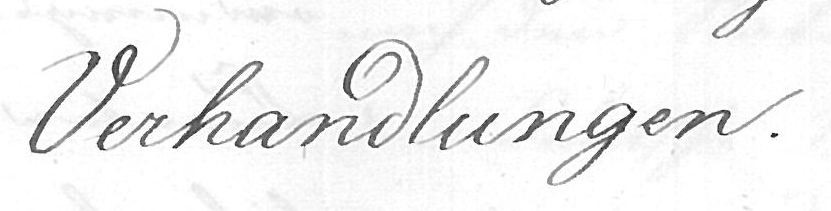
Verhandlungen.
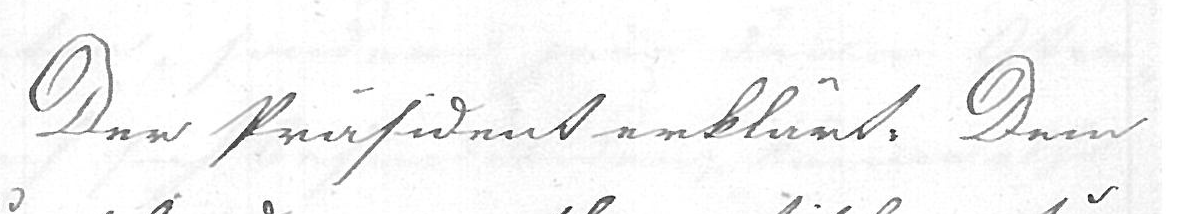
Der Präsident erklärt: Dem
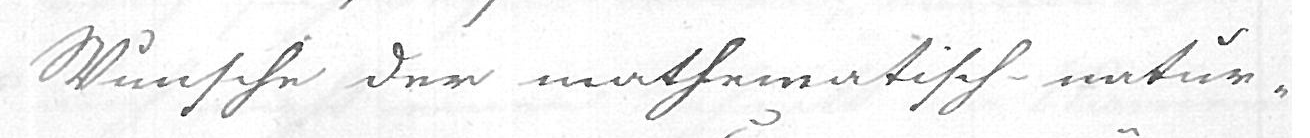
Wünsche der mathematisch-natur-
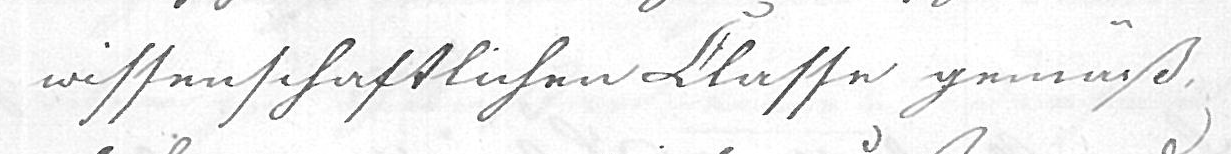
wissenschaftlichen Classe gemäß
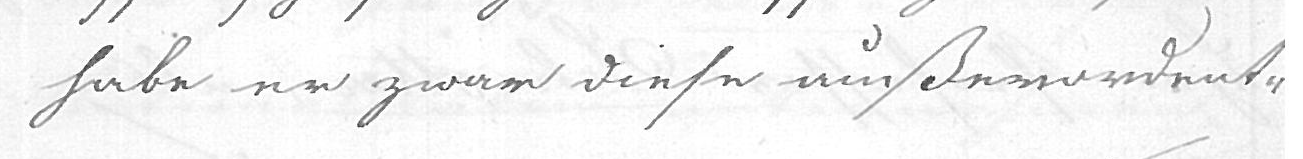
habe er zwar diese außerordent-
